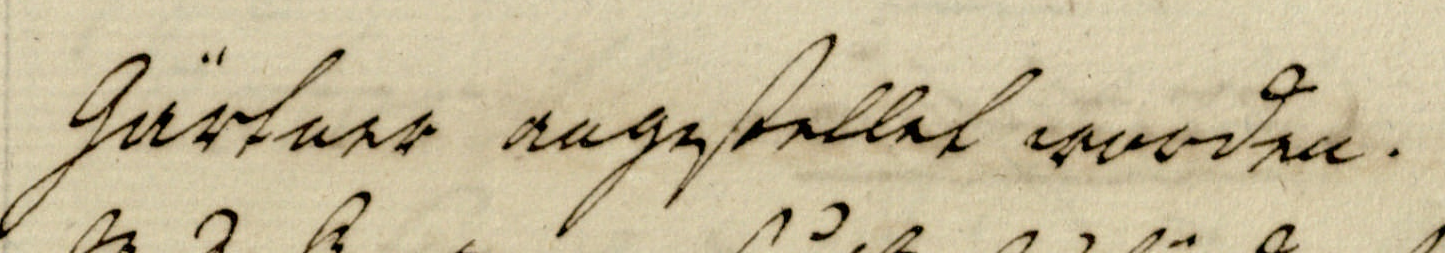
Gärtner angestellet worden.
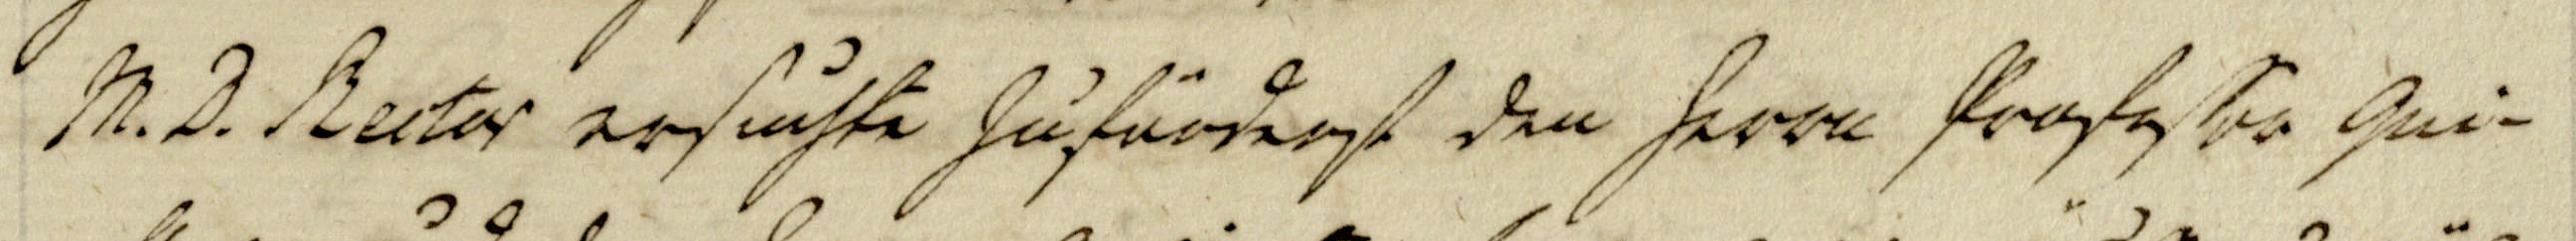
M. D. Rector ersuchte zuförderst den Herrn Professor Qui¬
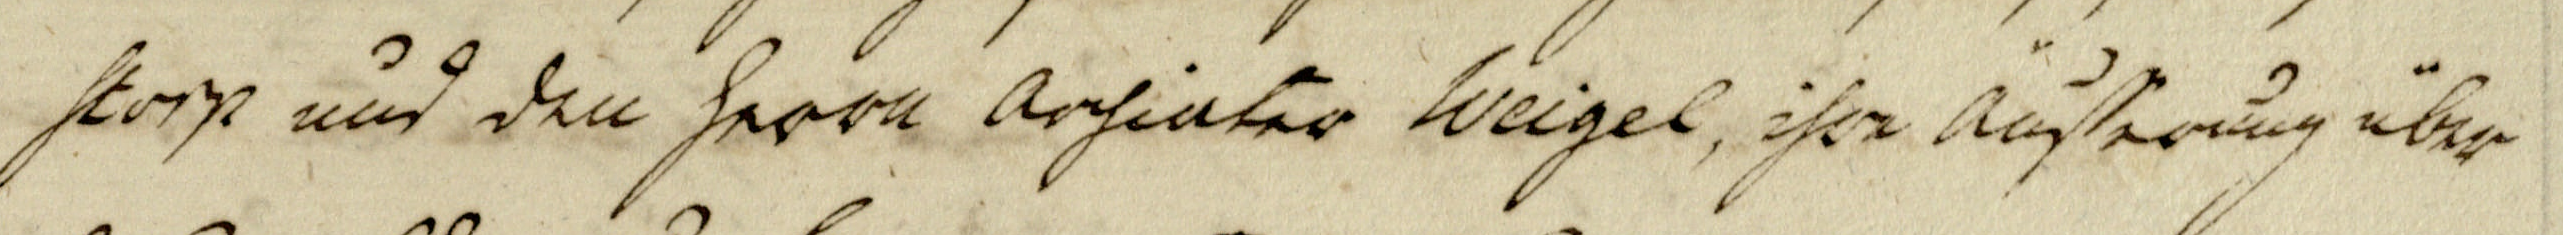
storp und den Herrn Archiater Weigel, ihre Äusserung über
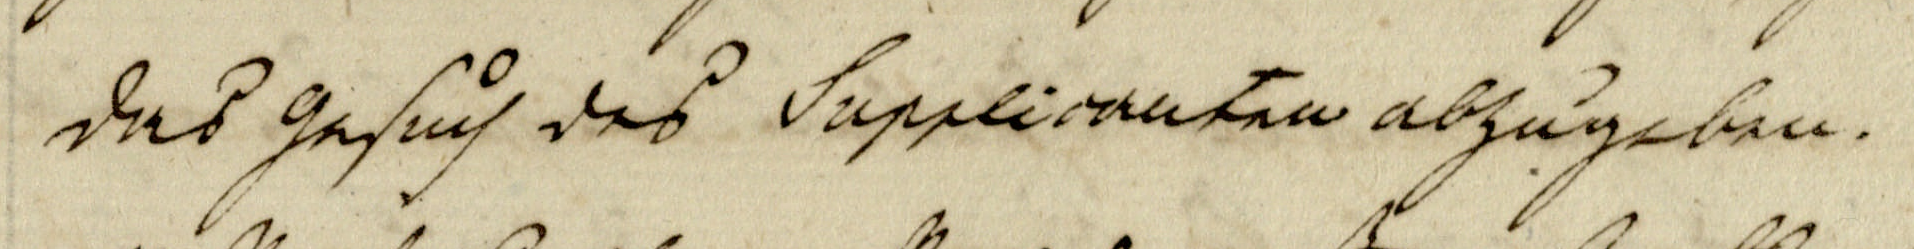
das Gesuch des Supplicanten abzugeben.
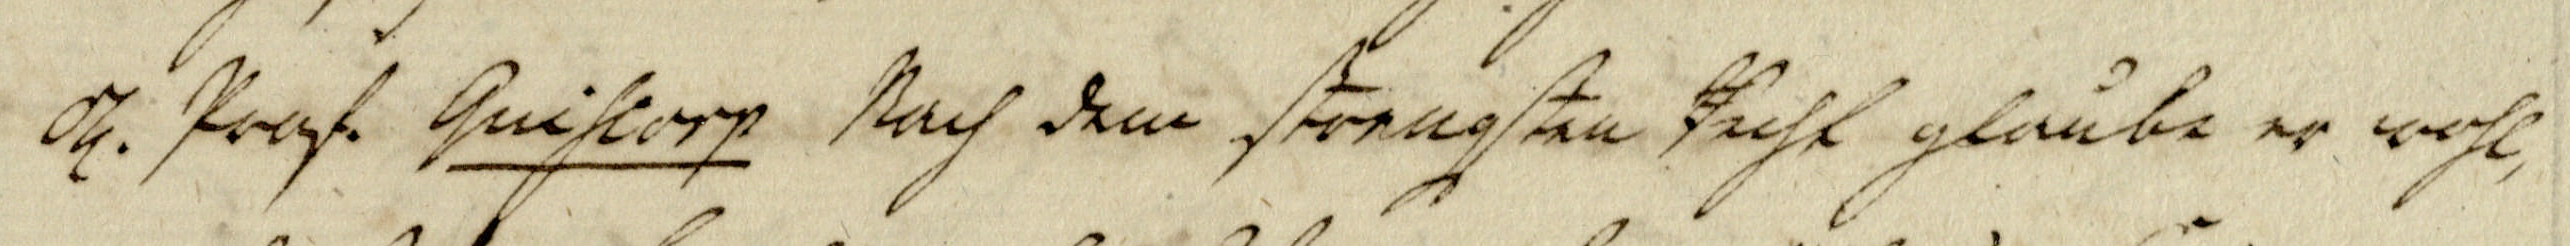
dh. Prof. Quistorp Nach dem strengsten Recht glaube er wohl,
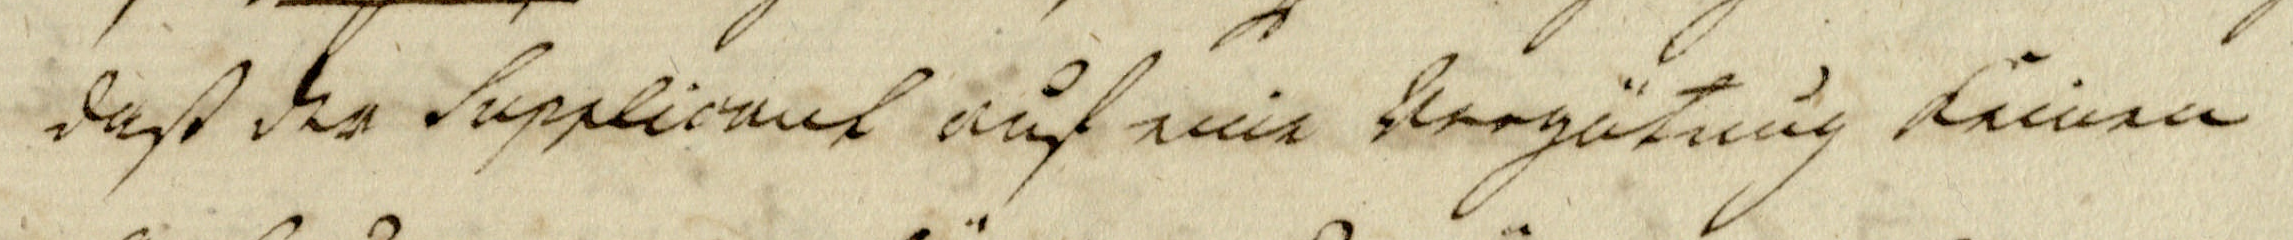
daß der Supplicant auf eine Vergütung keinen
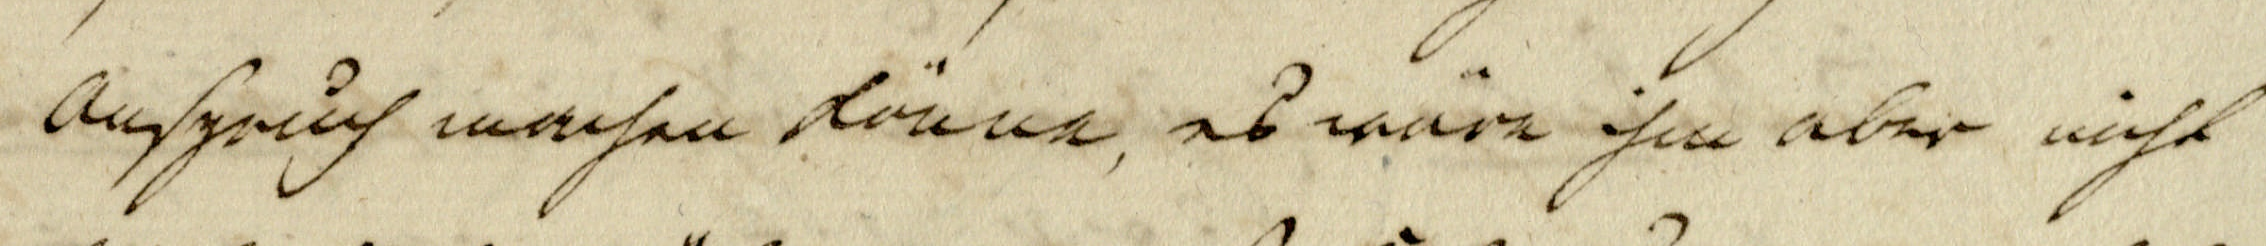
Anspruch machen könne, es wäre ihm aber nicht
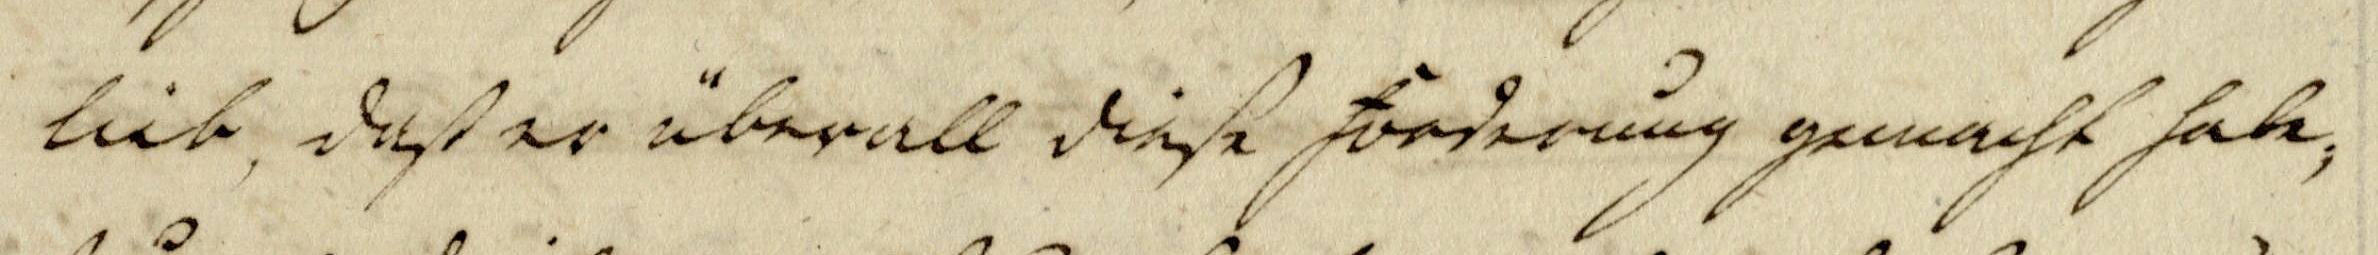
lieb, daß er überall diese Forderung gemacht habe,
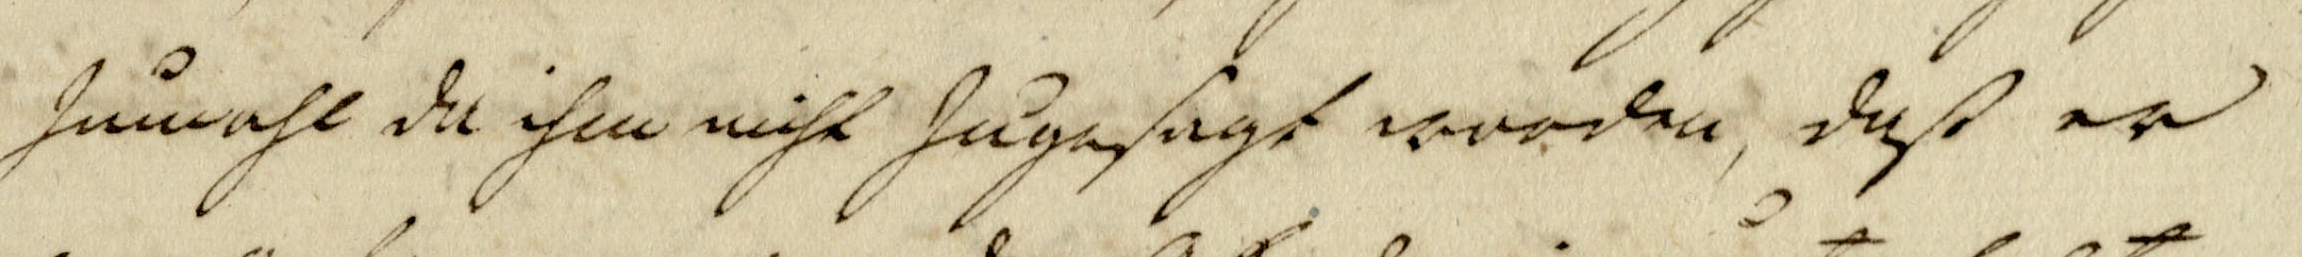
zumahl da ihm nicht zugesagt worden, daß er
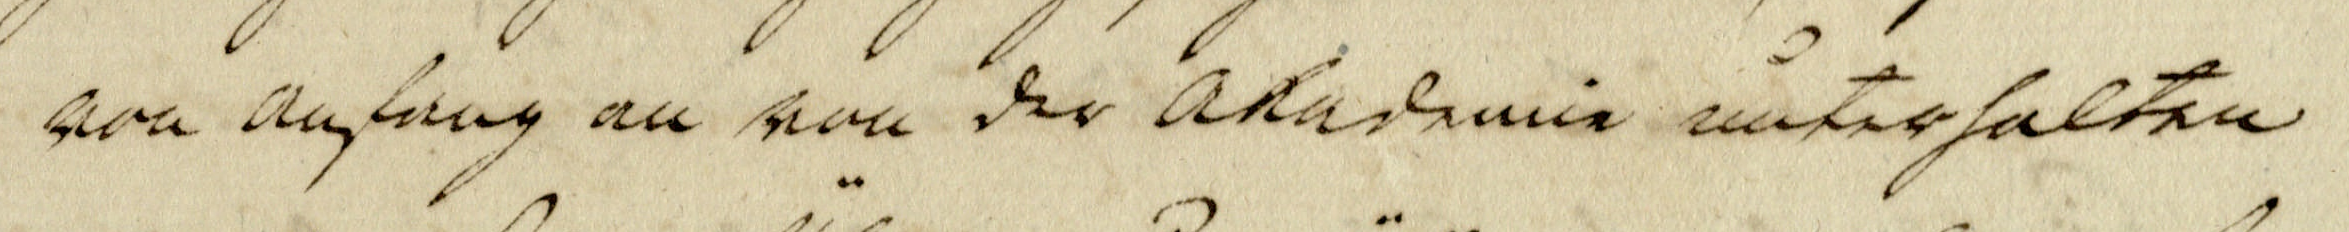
von Anfang an von der Akademie unterhalten
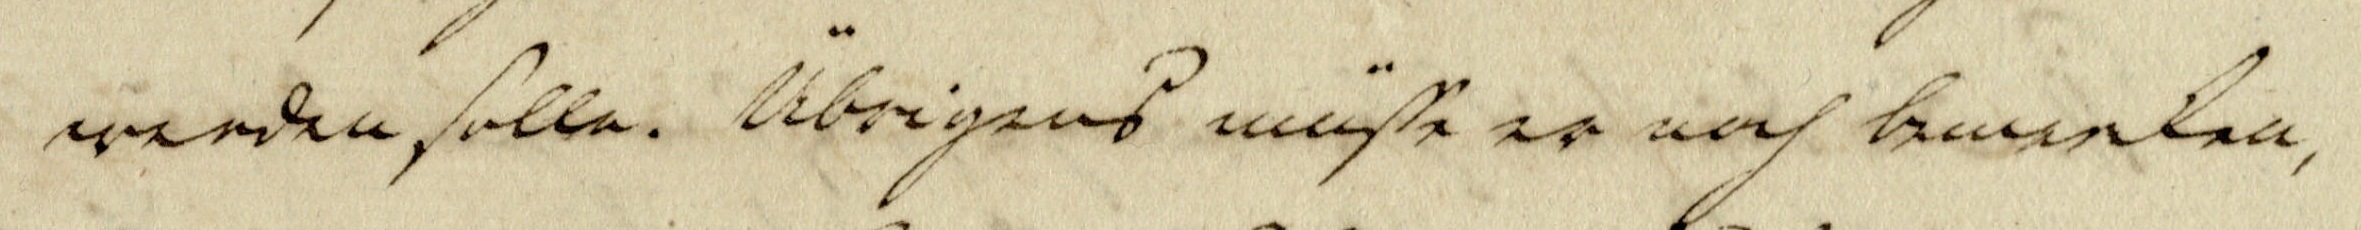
werden solle. Übrigens müsse er noch bemerken,
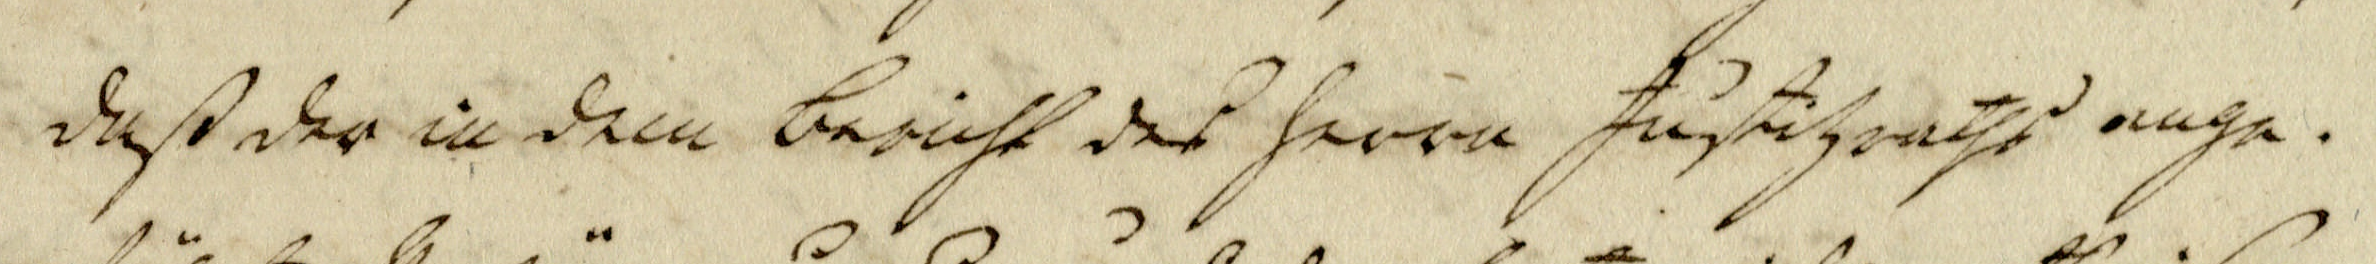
daß der in dem Bericht des Herrn Justizraths ange¬
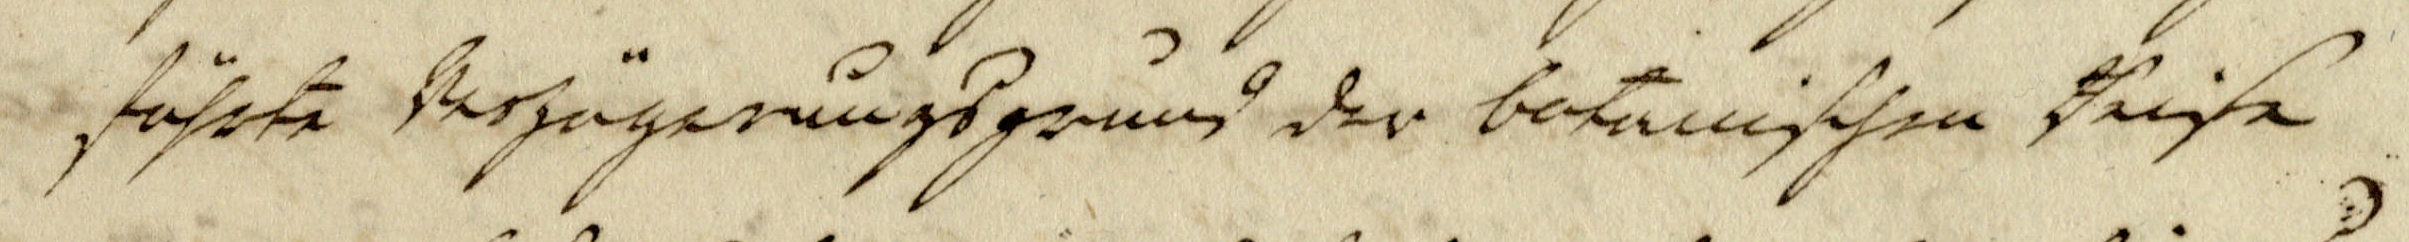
führte Verzögerungsgrund der botanischen Reise
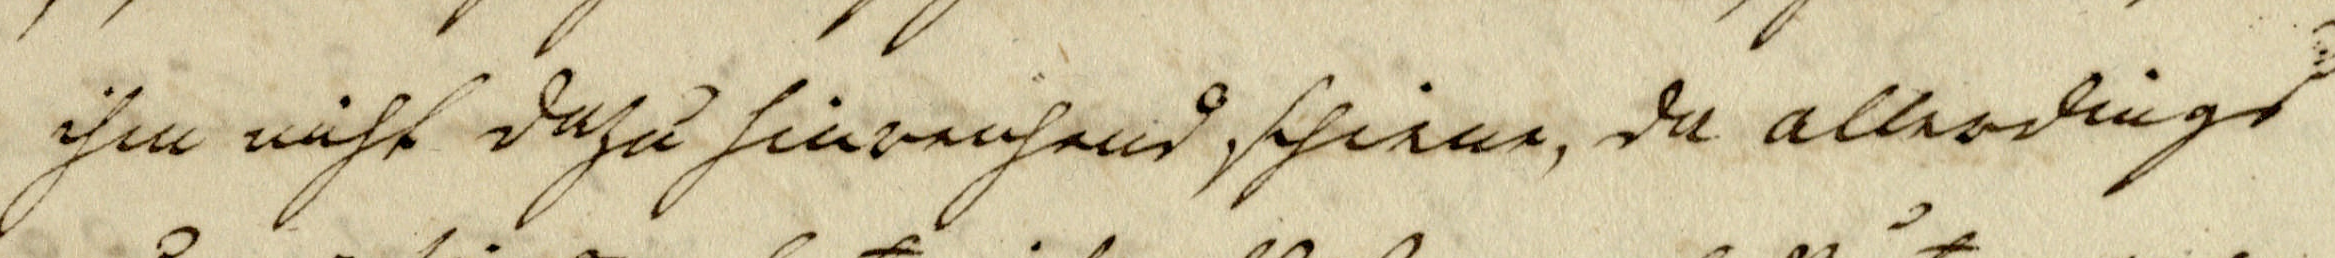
ihm nicht dazu hinreichend schiene, da allerdings
